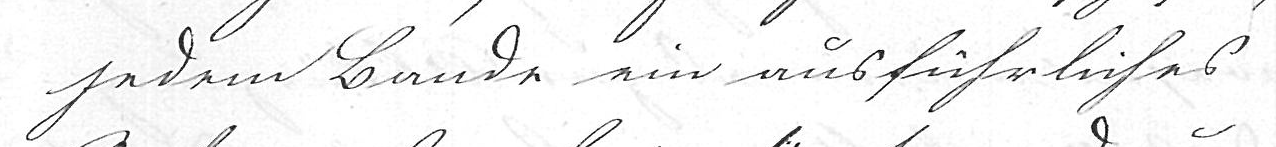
jedem Bande ein ausführliches
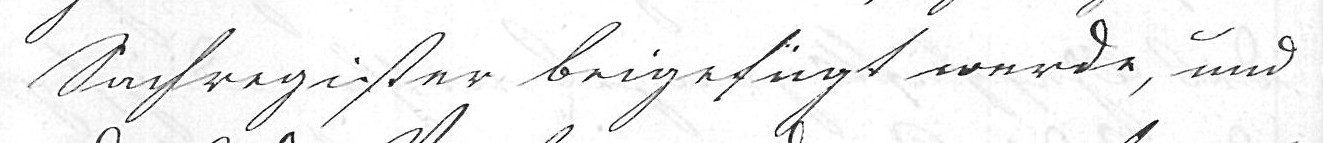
Sachregister beigefügt werde, und
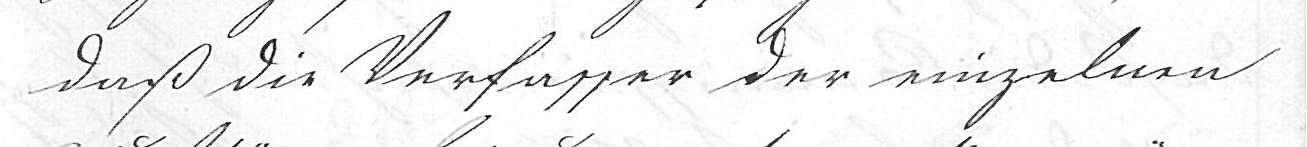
daß die Verfasser der einzelnen
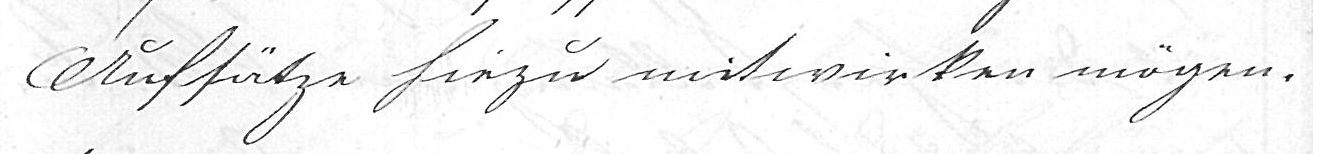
Aufsätze hiezu mitwirken mögen.
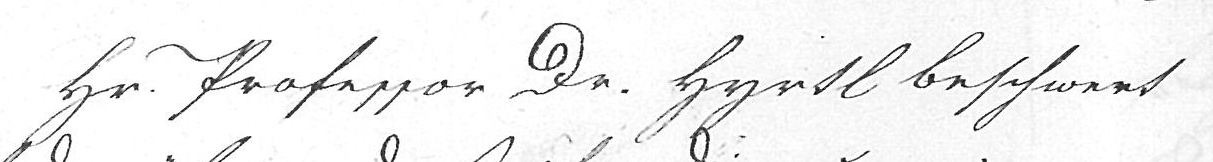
Hr. Professor Dr. Hyrtl beschwert
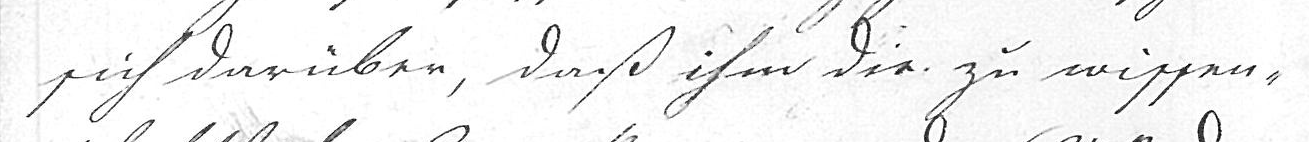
sich darüber, daß ihm die zu wissen-
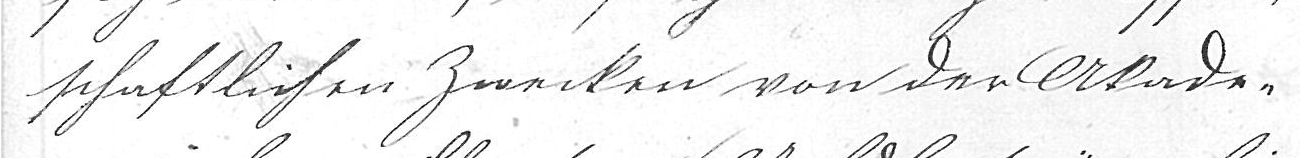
schaftlichen Zwecken von der Akade-
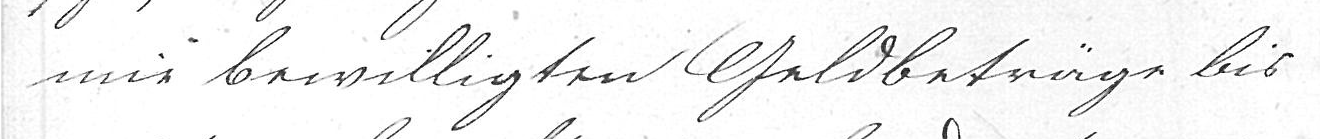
mie bewilligten Geldbeträge bis
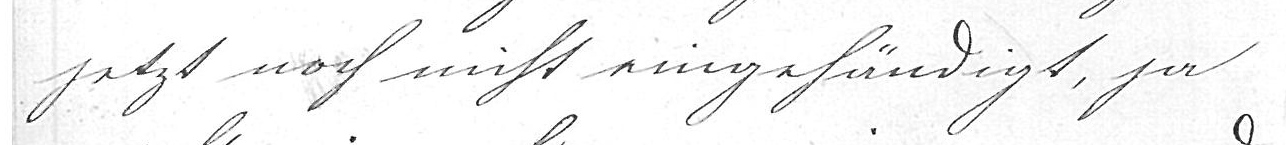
setzt noch nicht eingehändigt, ja
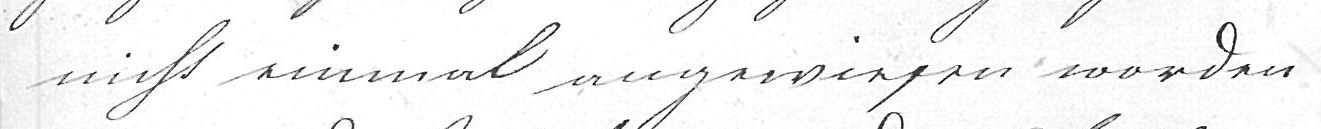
nicht einmal angewiesen worden
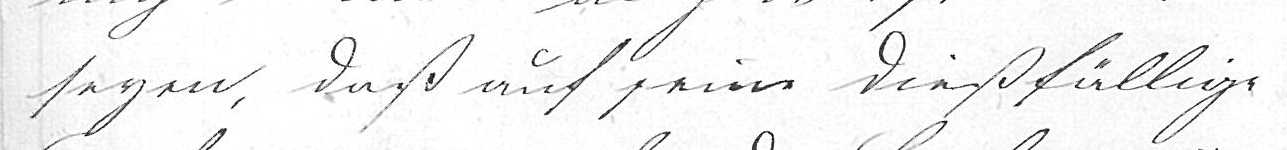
seyen, daß auf seine dießfällige
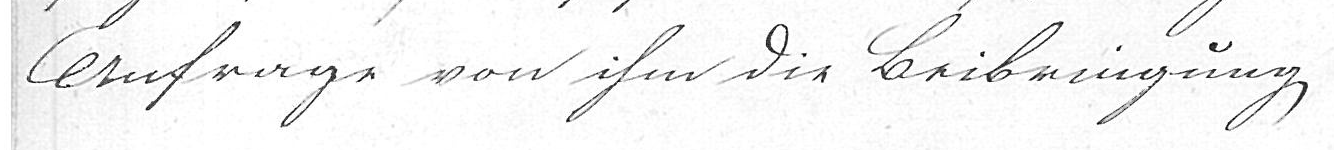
Anfrage von ihm die Beibringung
